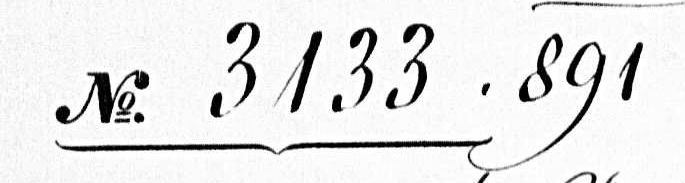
No. 3133 - 1891
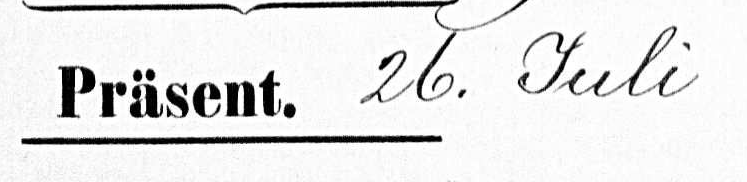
Präsent. 26. Juli
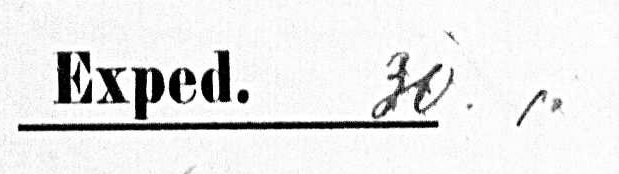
Exped. 30. „
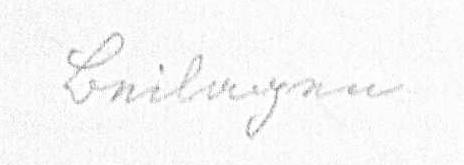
Beilagen
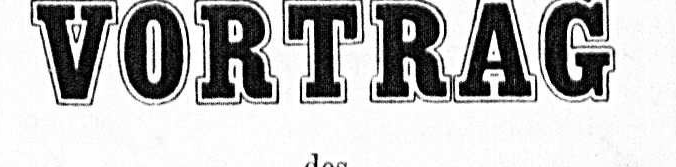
VORTRAG
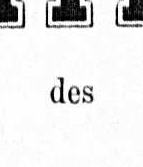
des
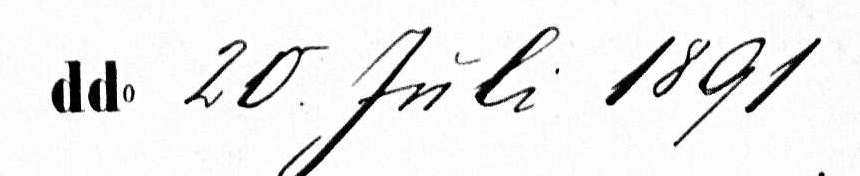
ddo 20. Juli 1891
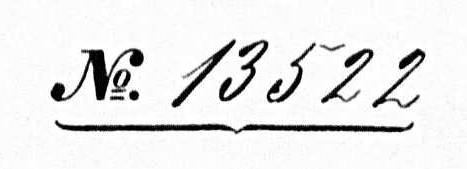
No. 13522
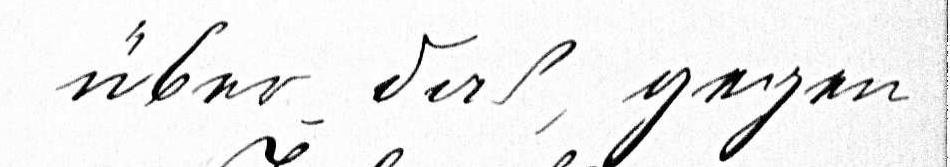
Über das, gegen
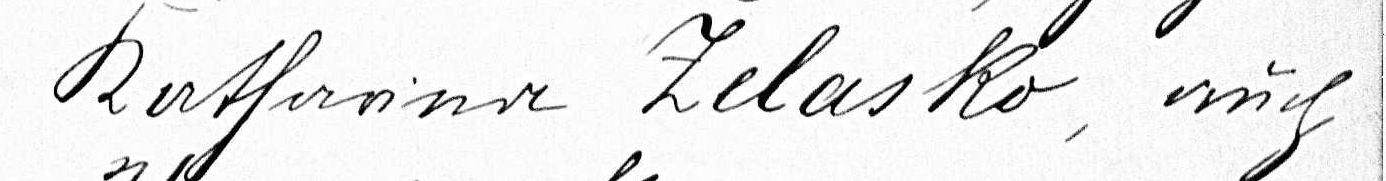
Katharina Želasko, auch
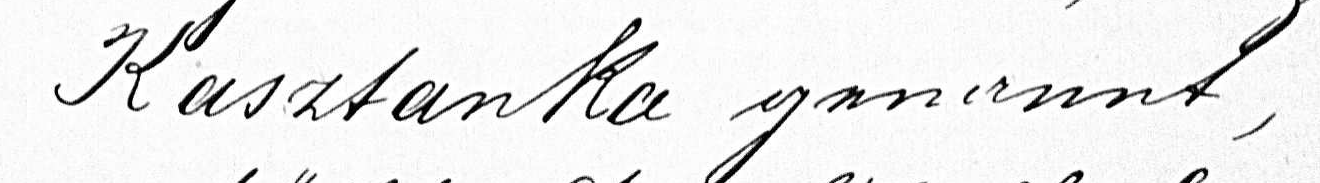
Kasztanka genannt,
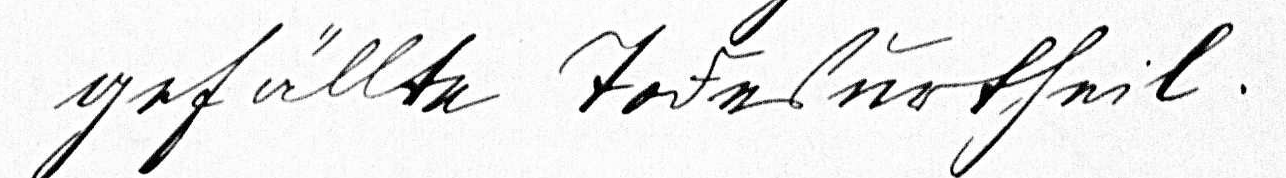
gefällte Todesurtheil.
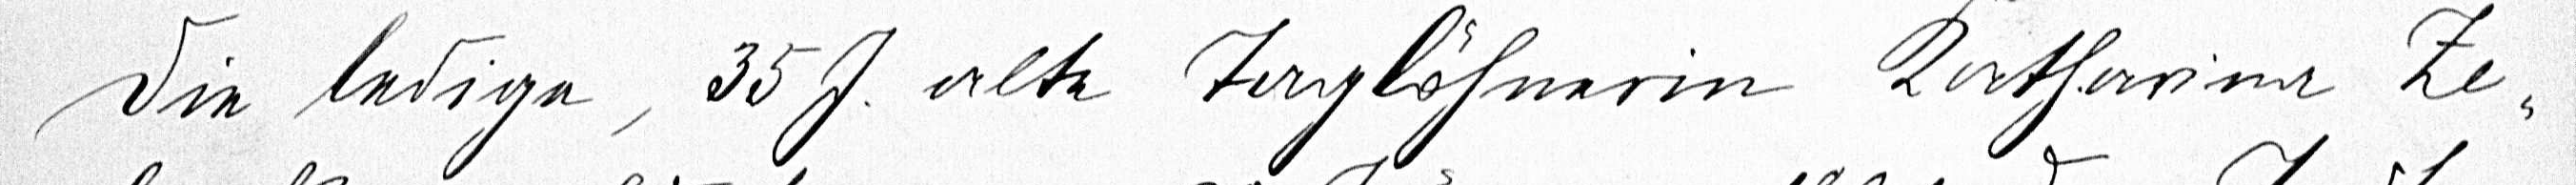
Die ledige, 35 J. alte Taglöhnerin Katharina Že¬
